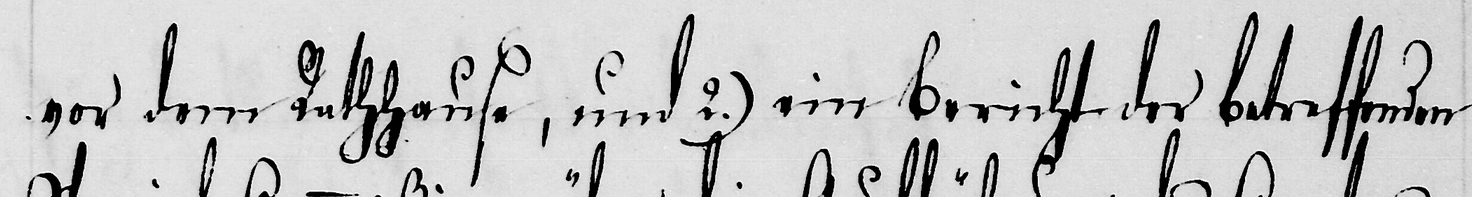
vor dem Rathhause, und 2.) ein Bericht der betreffen¬
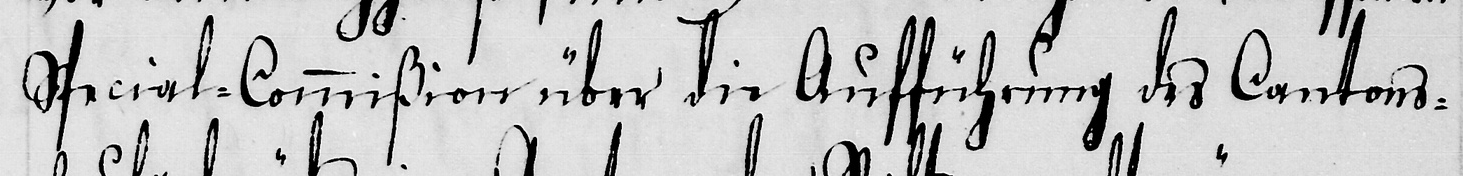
Special-Commißion über die Aufführung des Cantons¬
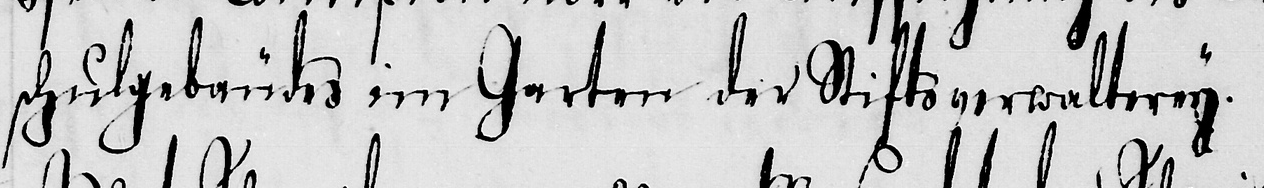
schulgebäudes im Garten der Stiftsverwalterey.
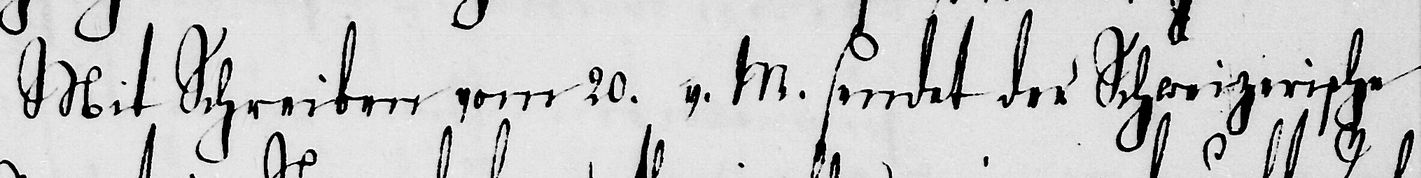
Mit Schreiben vom 20. v. M. sendet der Schweizerische
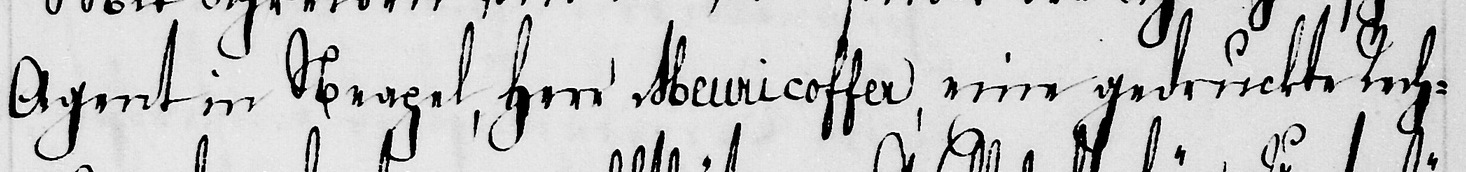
Agent in Neapel, Herr Meuricoffer, eine gedruckte Rech¬
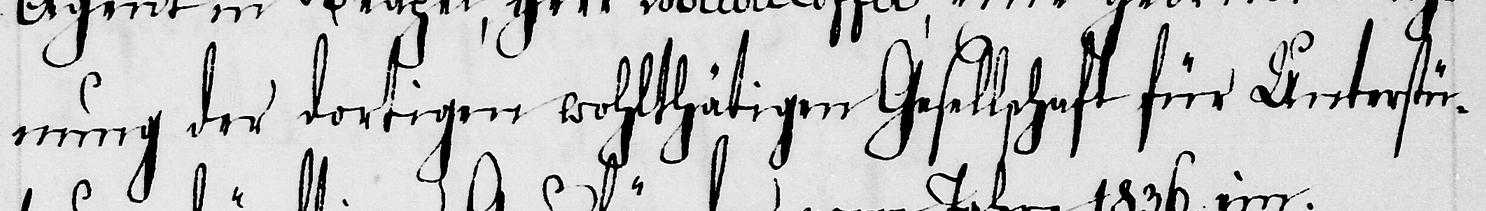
nung der dortigen wohltätigen Gesellschaft für Unterstü¬
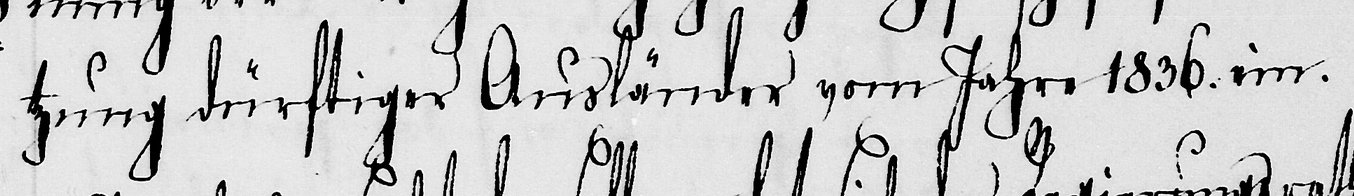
tzung dürftiger Ausländer vom Jahre 1836. ein.
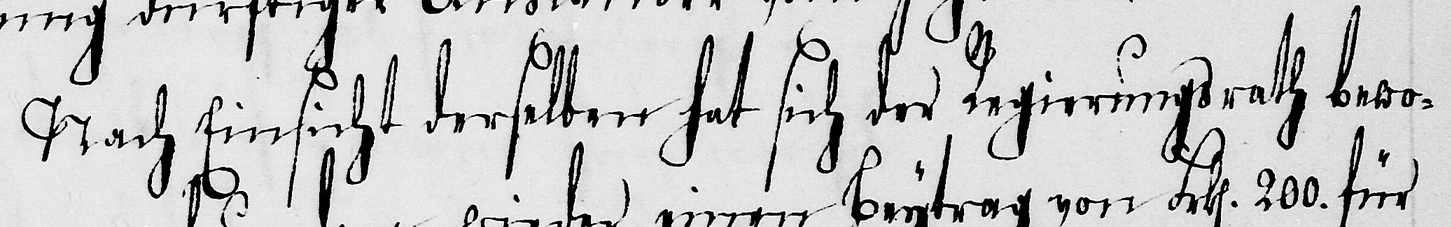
Nach Einsicht derselben hat sich der Regierungsrath bewo¬
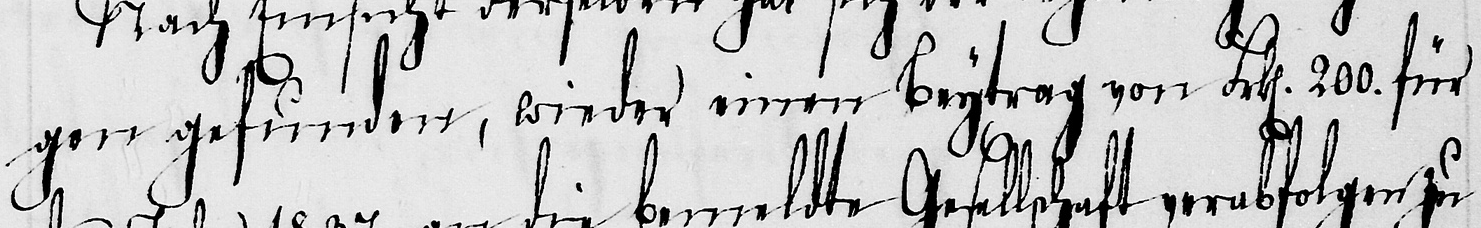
gen gefunden, wieder einen Beytrag von Frk[en]. 200. für
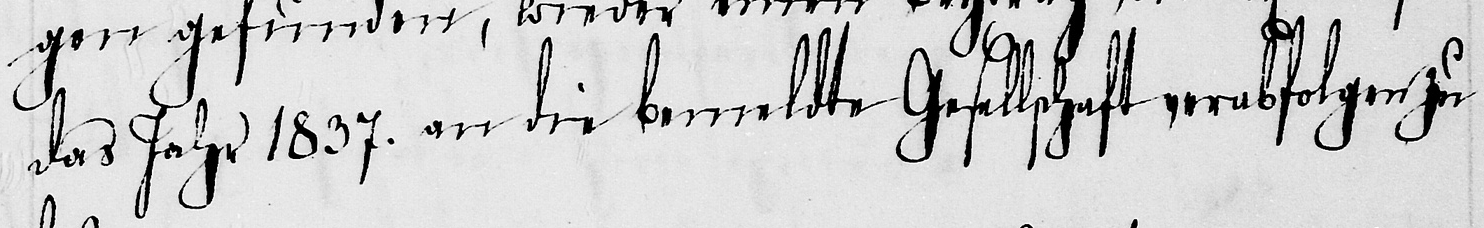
das Jahr 1837. an die bemeldte Gesellschaft verabfolgen
